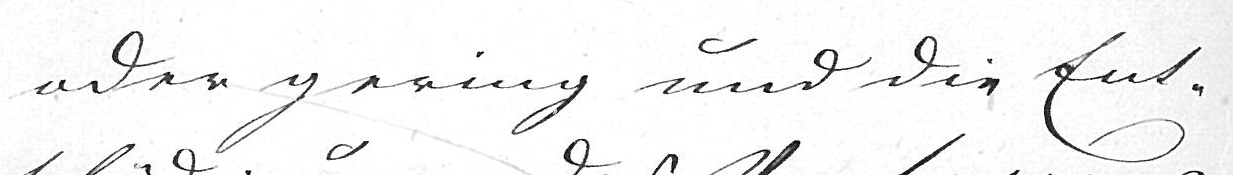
oder gering und die Ent-
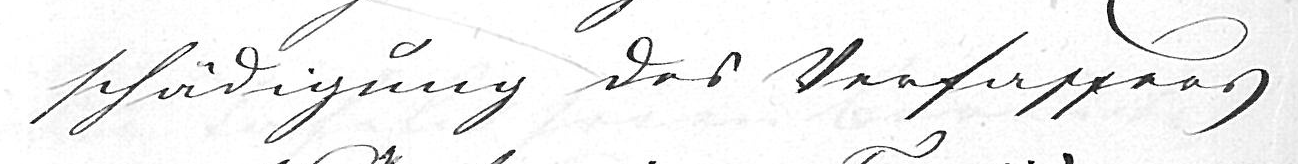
schädigung des Verfassers
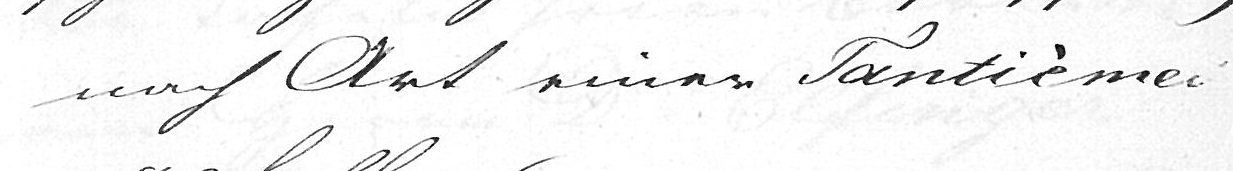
nach Art einer Tantième
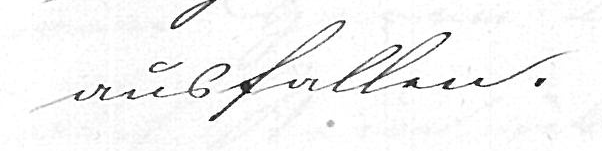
ausfallen.
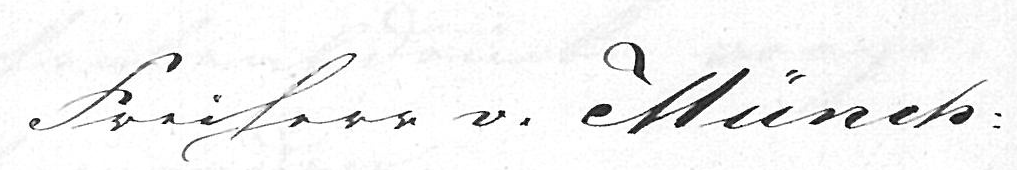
Freiherr v. Münch:
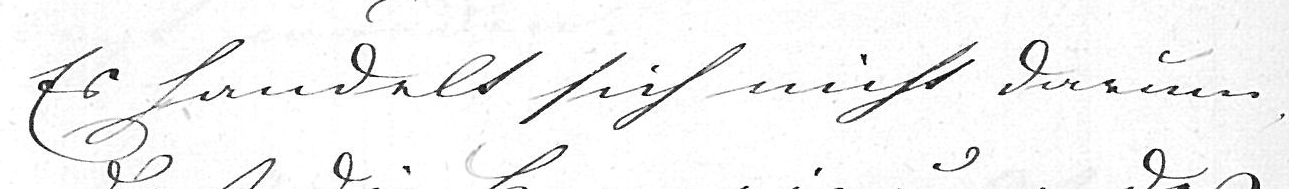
Es handelt sich nicht darum,
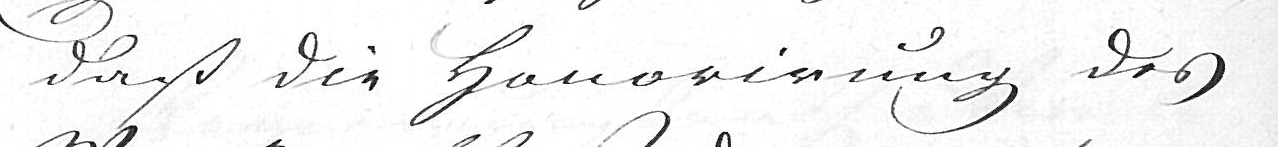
daß die Honorirung des
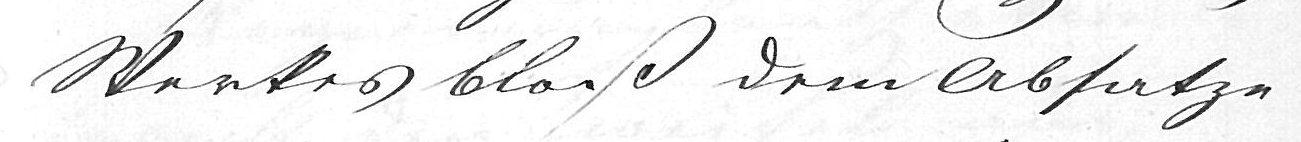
Werkes bloß dem Absatze
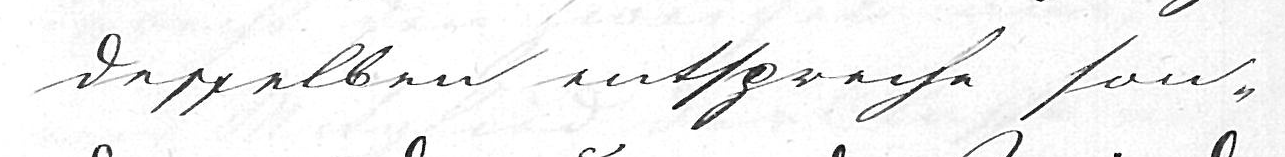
desselben entspreche son-
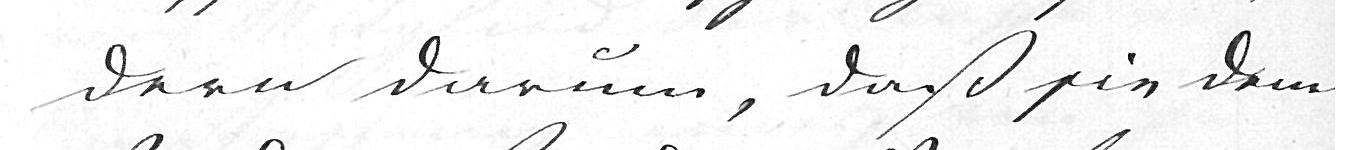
dern darum, daß sie dem
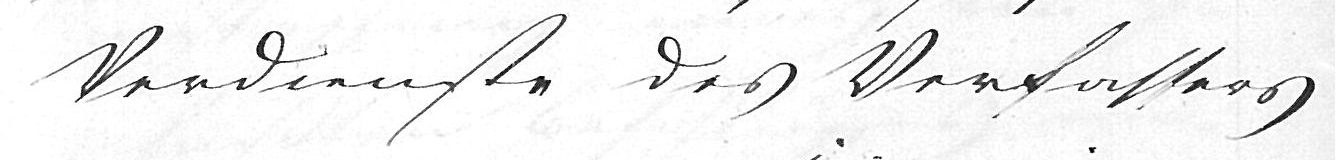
Verdienste des Verfassers
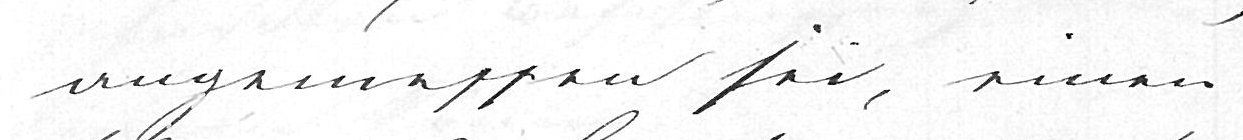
angemessen sei, einen
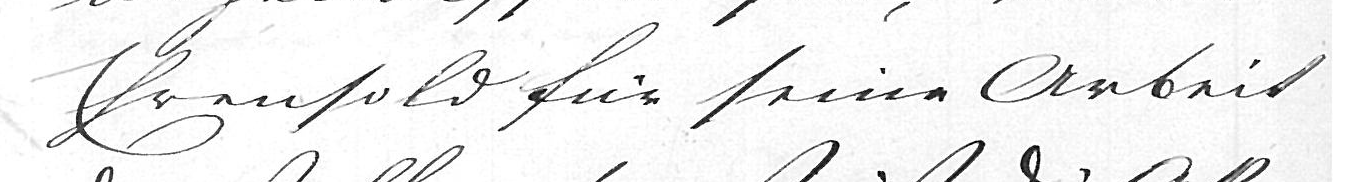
Ehrensold für seine Arbeit
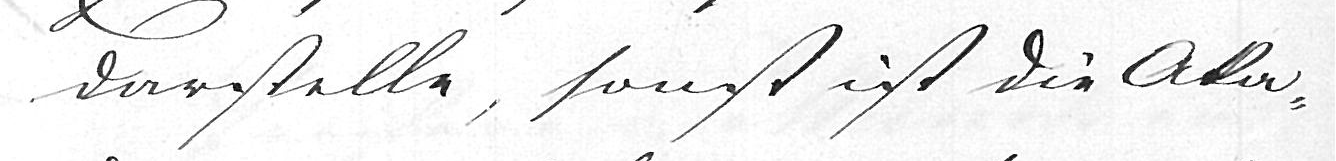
darstelle, sonst ist die Aka-
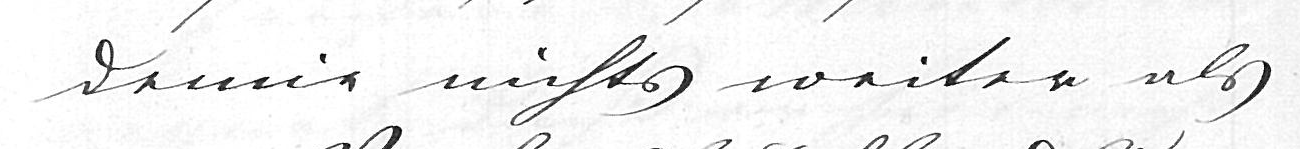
demie nichts weiter als
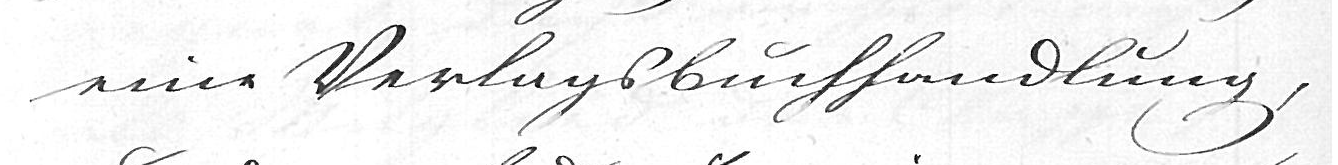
eine Verlagsbuchhandlung
